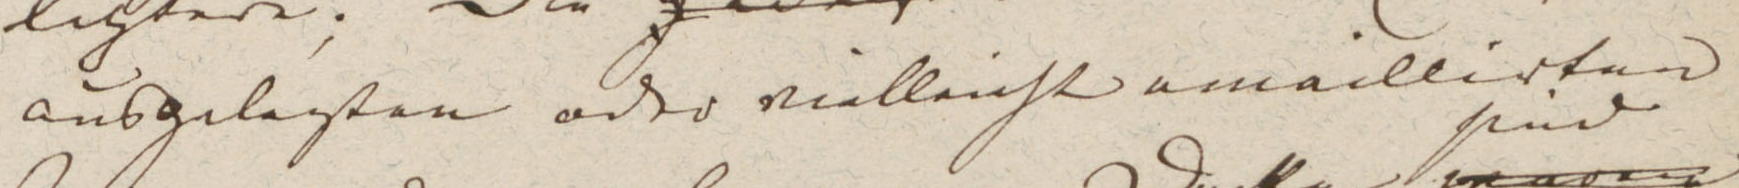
ausgelegten oder vielleicht emaillirten
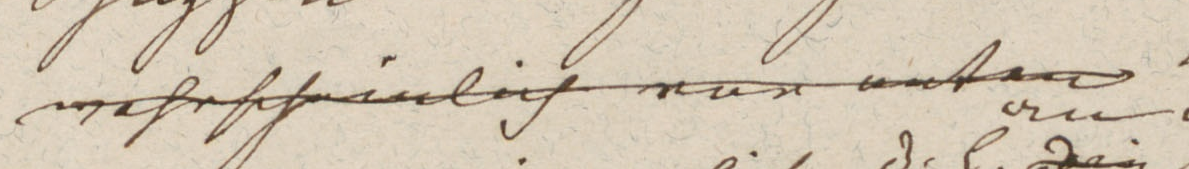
wahrscheinlich von unten
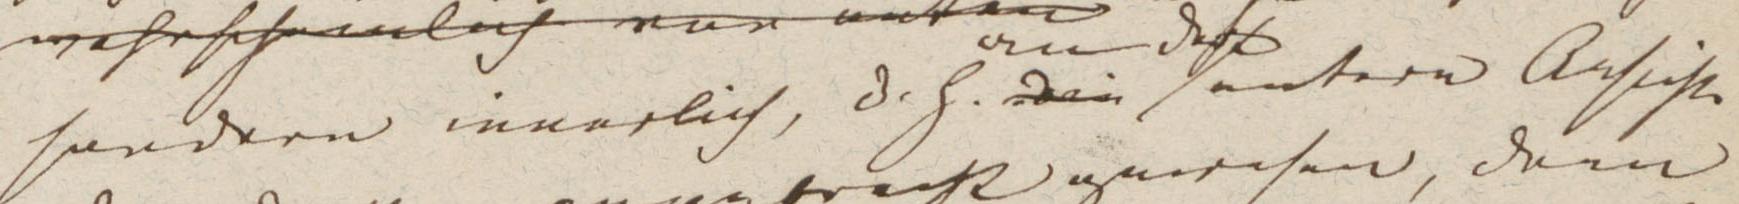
sondern innerlich, d. h. an der untern Ansicht
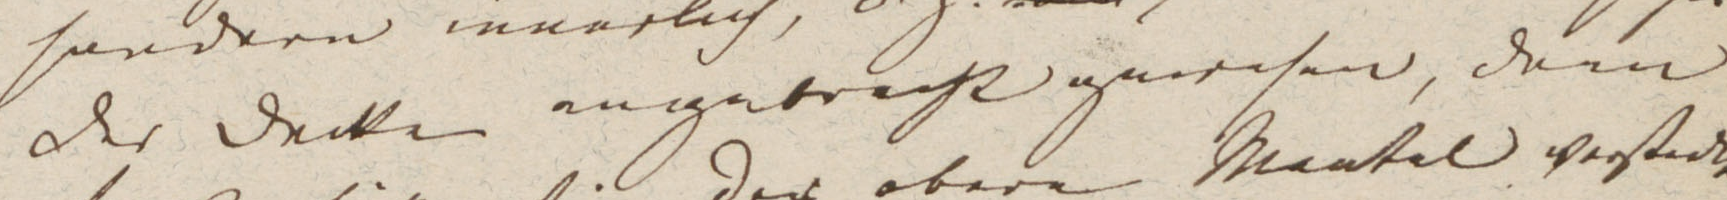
der Decke angebracht gewesen, denn
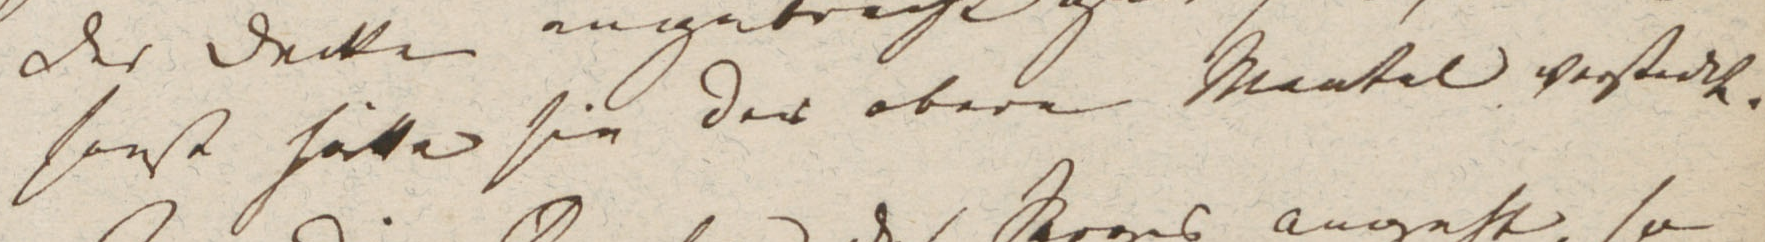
sonst hätte sie der obere Mantel versteckt.
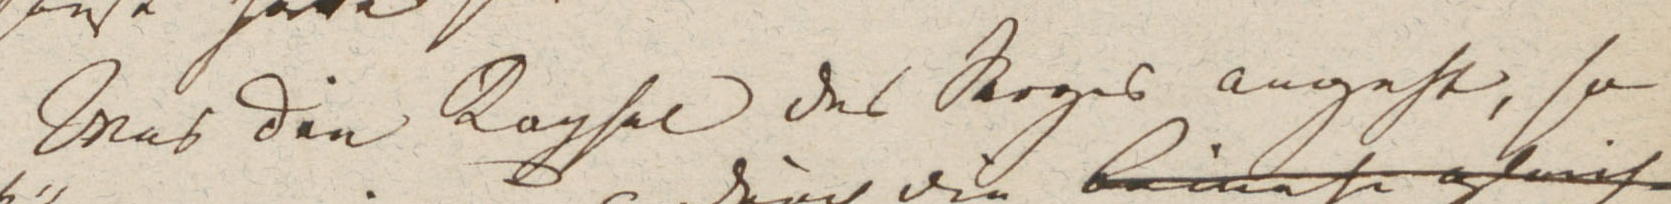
Was die Kapsel des Sarges angeht, so
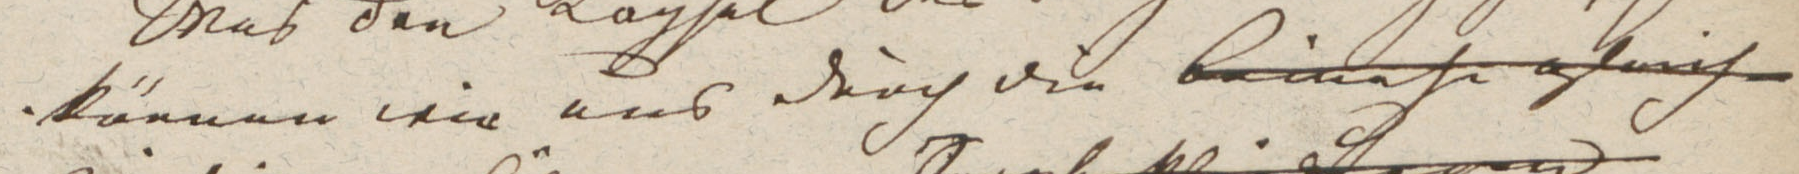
können wir uns durch die beinahe gleich-
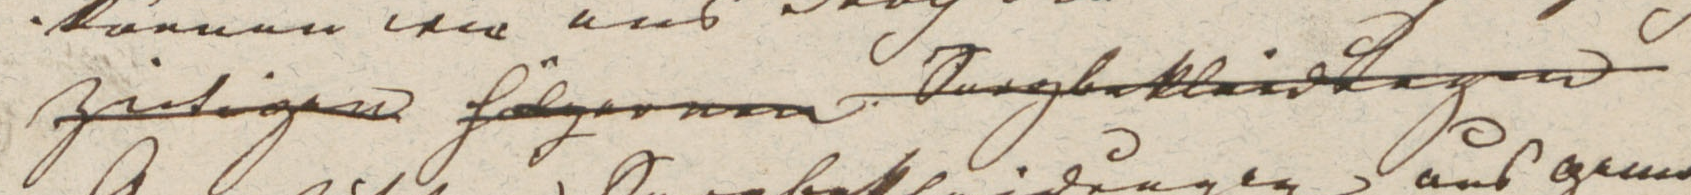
zeitigen hölzernen Sargbekleidungen
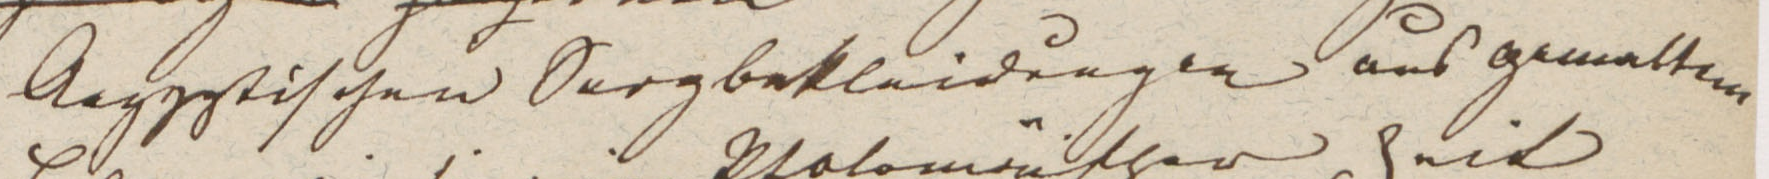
Aegyptischen Sargbekleidungen aus gemaltem
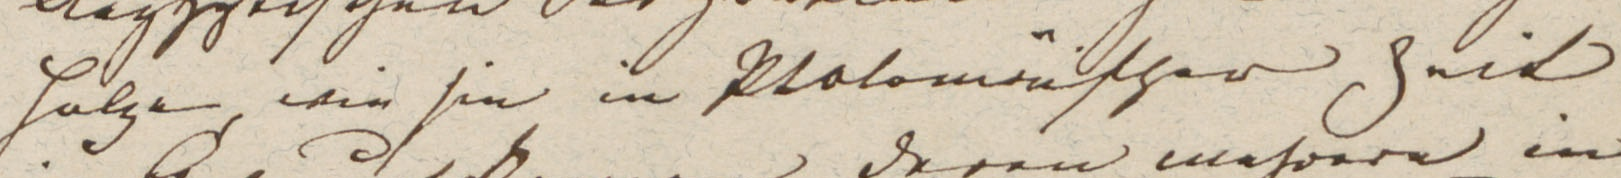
Holze, wie sie in Ptolemäischer Zeit
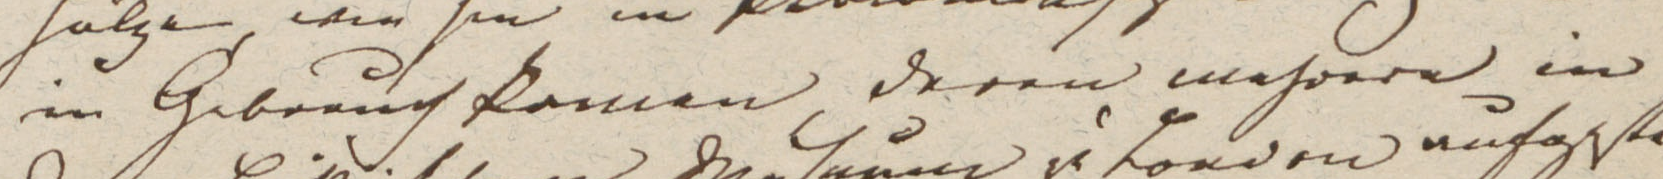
in Gebrauch kamen, deren mehrere in
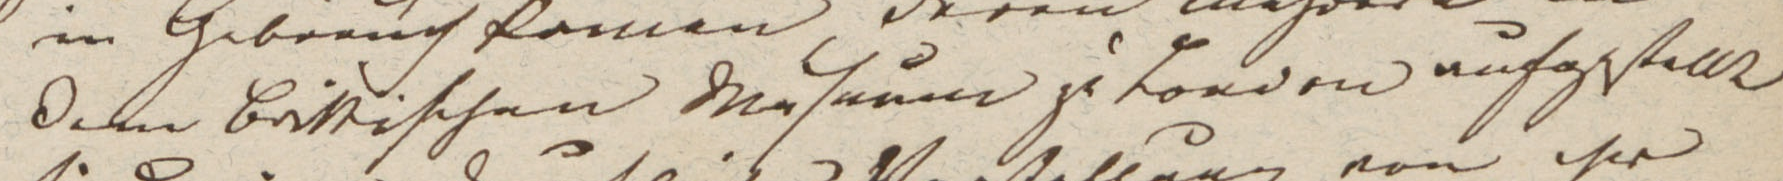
dem Brittischen Museum zu London aufgestellt
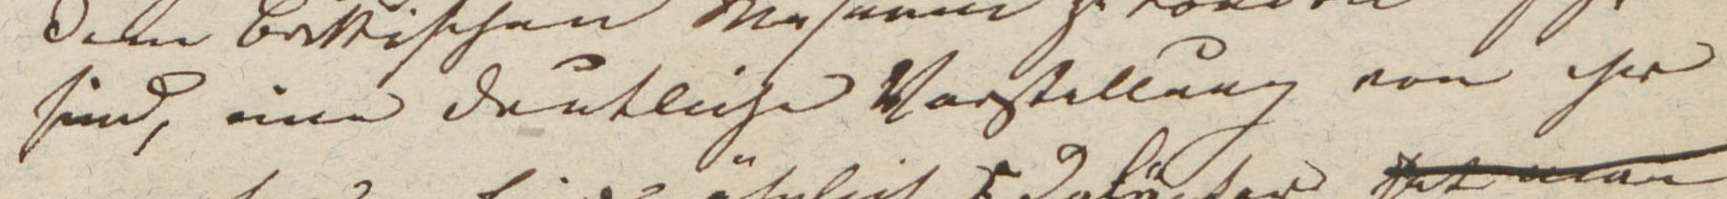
sind, eine deutliche Vorstellung von ihr
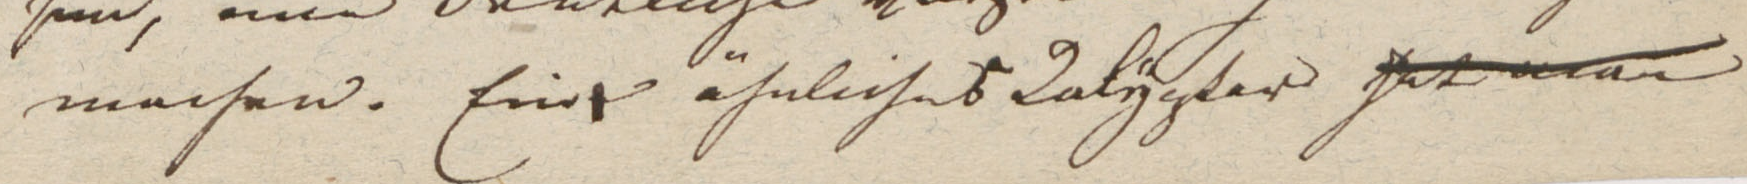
machen. Eine ähnliches Kalypter hat man
